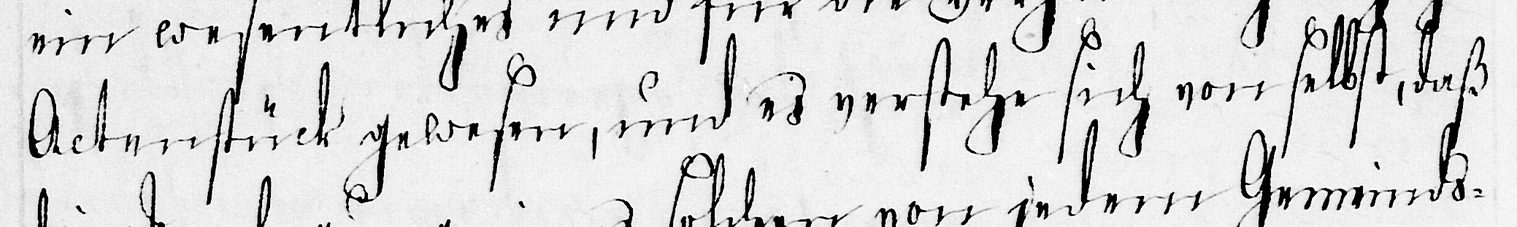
Actenstück gewesen, und es verstehe sich von selbst, daß
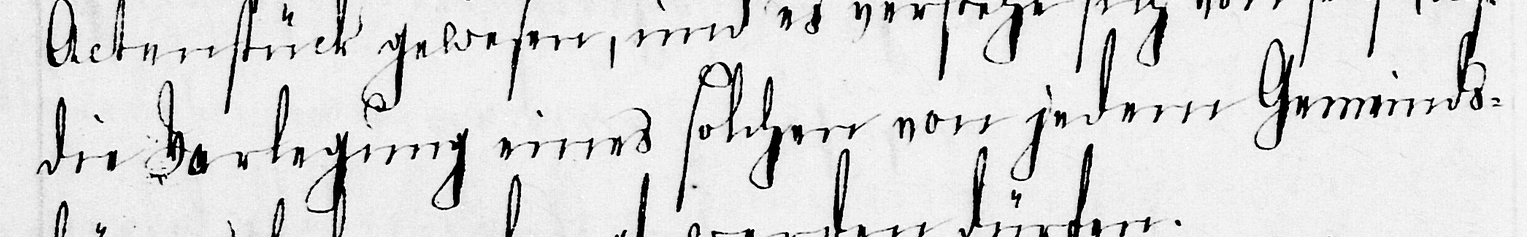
die Verlegung eines solchen von jedem Gemeinds¬
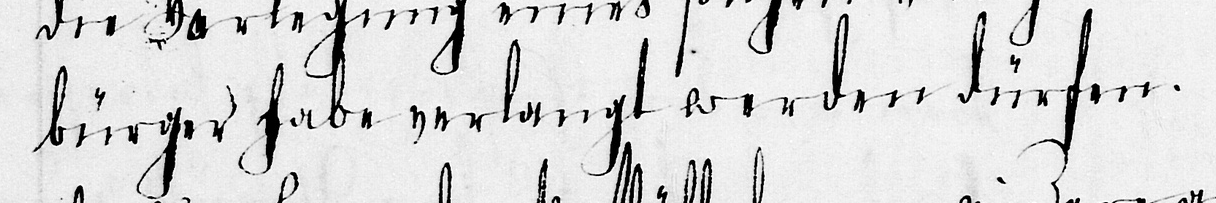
bürger habe verlangt werden dürfen.
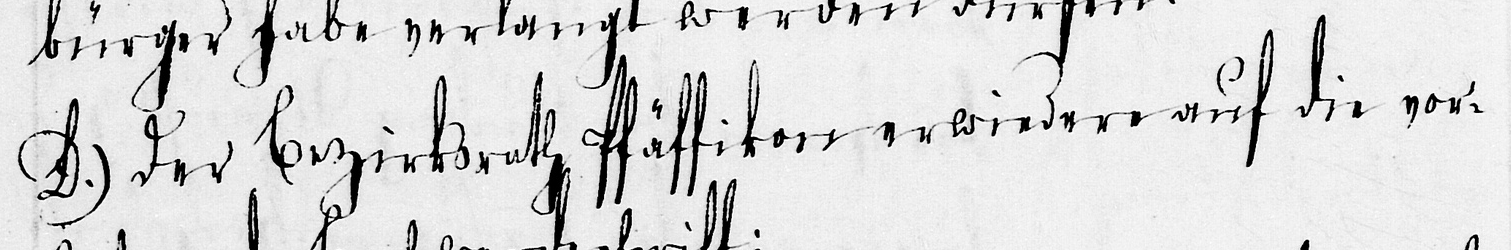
D.) Der Bezirksrath Pfäffikon erwiedere auf die vor¬
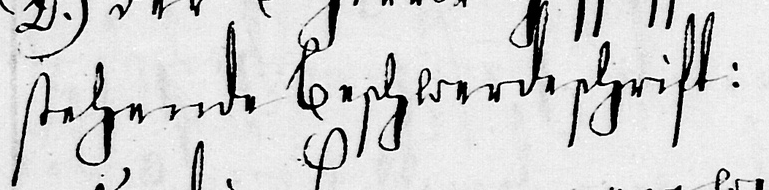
stehende Beschwerdeschrift:
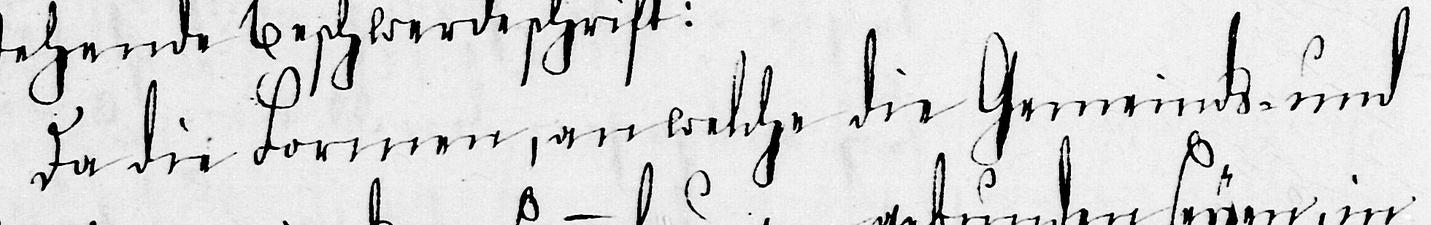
Da die Formen, an welche die Gemeinds- und
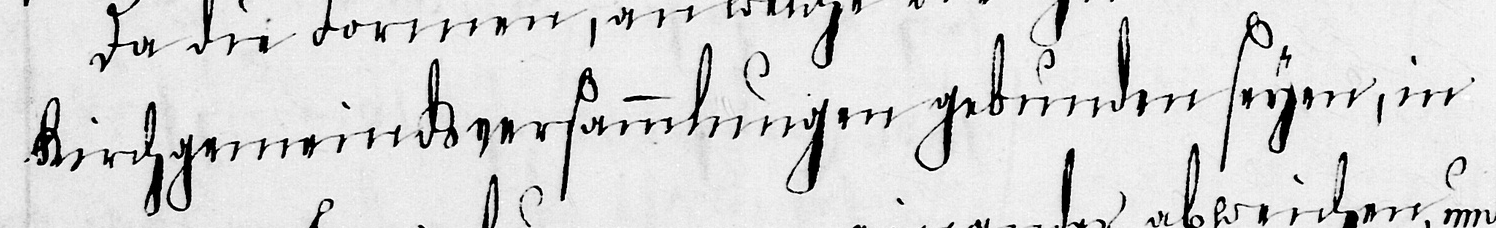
Kirchgmeindsversammlungen gebunden seyen, in
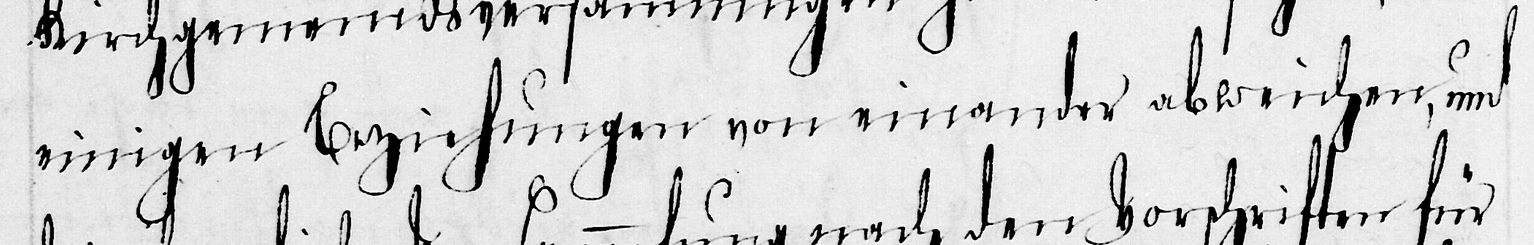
einigen Beziehungen von einander abweichen, und
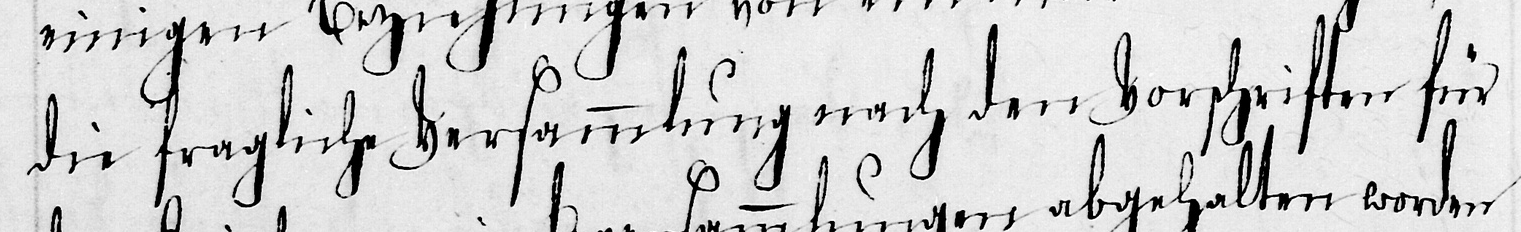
die fragliche Versammlung nach den Vorschriften für
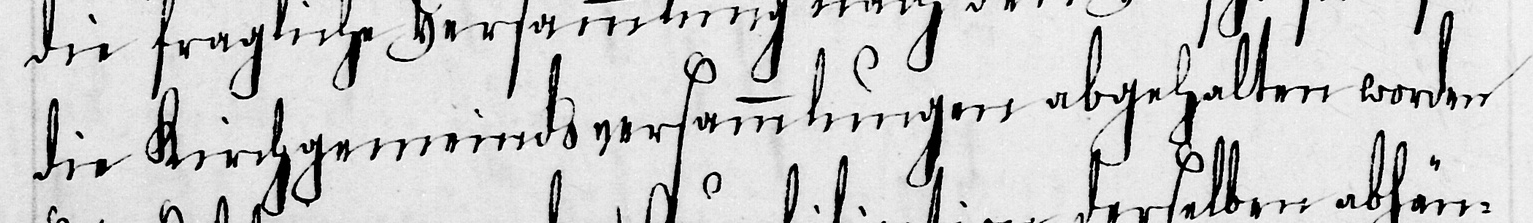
die Kirchgemeindsversammlungen abgehalten worden
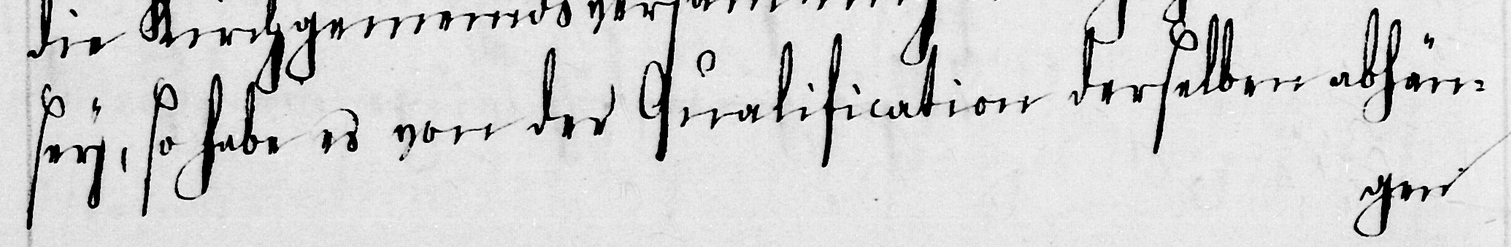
sey, so habe es von der Qualification derselben abhän-
